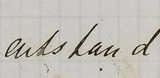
entstand
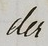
Frage,
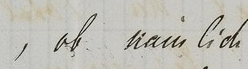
ob nämlich
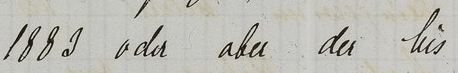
1883 oder aber der bis
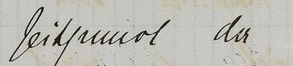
Zeitpunct der
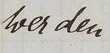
Bahn durch
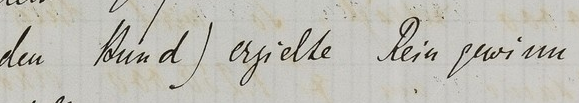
den Bund) erzielte Reingewinn
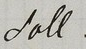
soll.
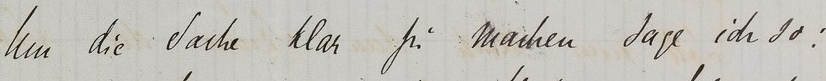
Um die Sache klar zu machen sage ich so:
